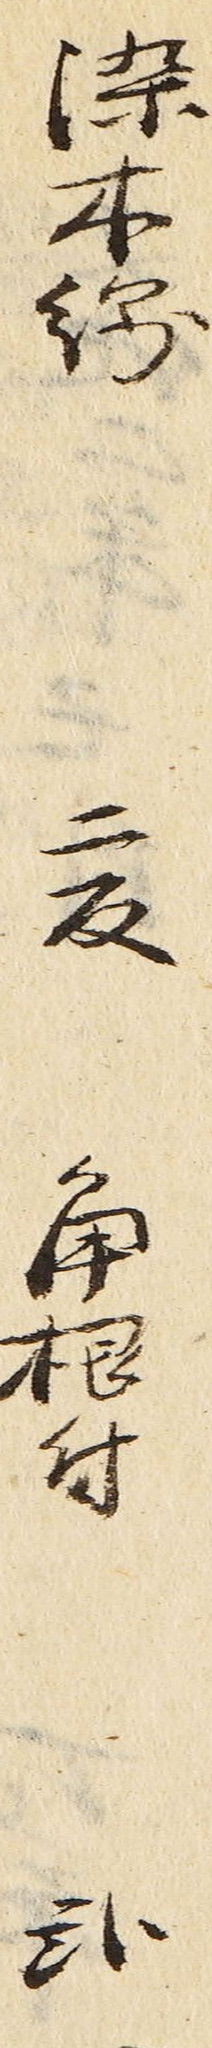染木綿二反角根付弐
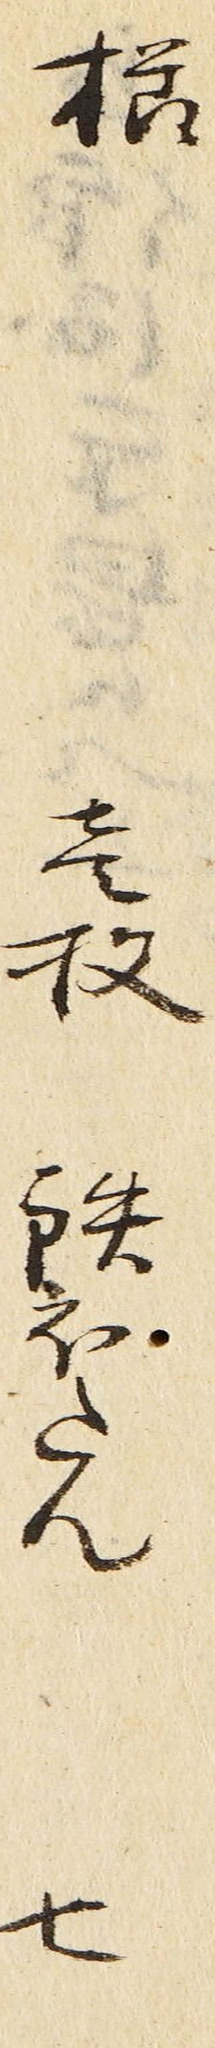櫛壱枚鉄ぼたん七
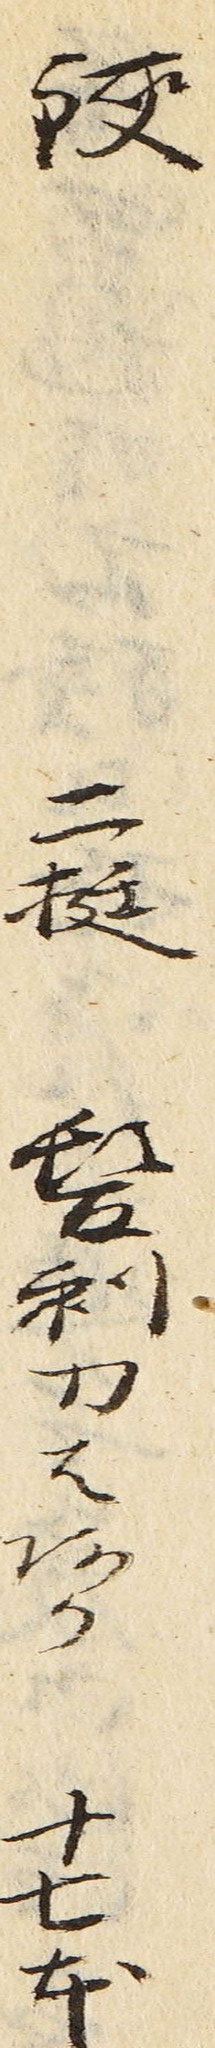鋏二挺髪剃刀はあり十七本
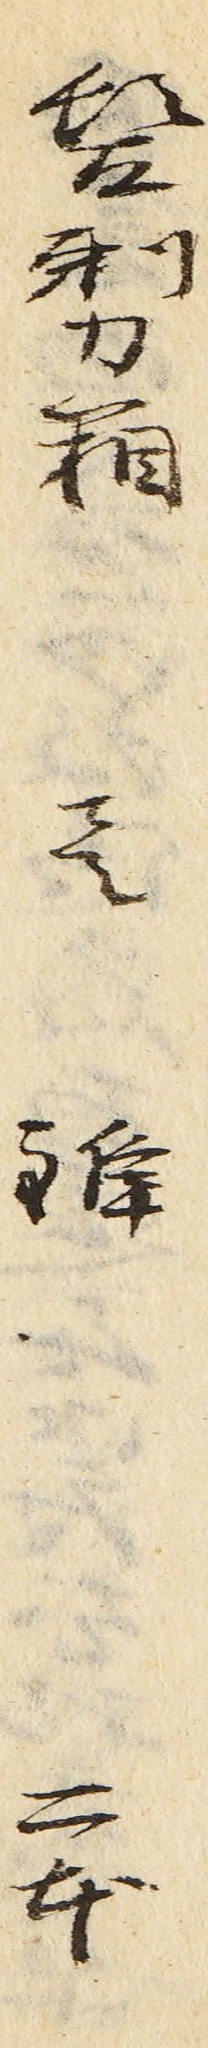髪剃刀箱壱錐二本
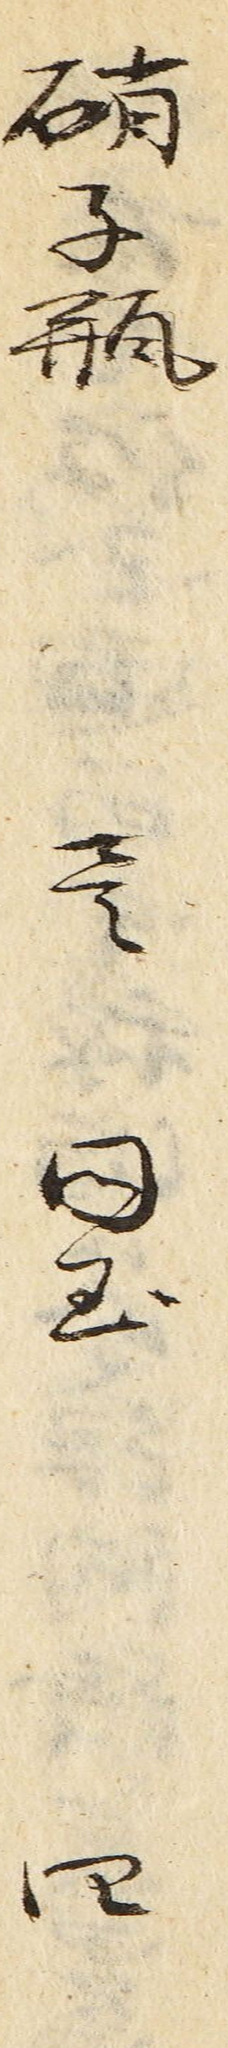硝子瓶壱同玉四
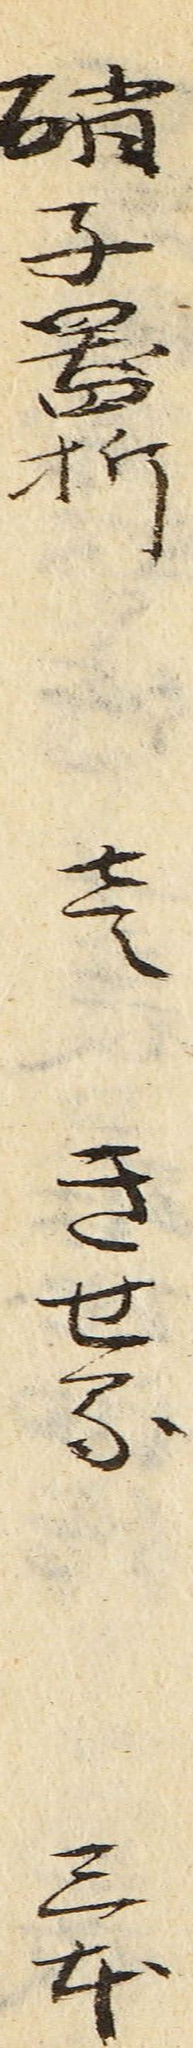硝子器折壱きせる三本

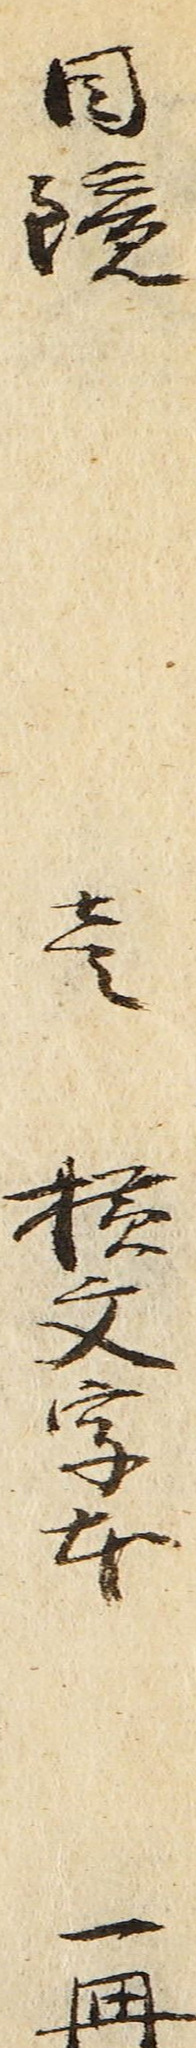目鏡壱横文字本一冊
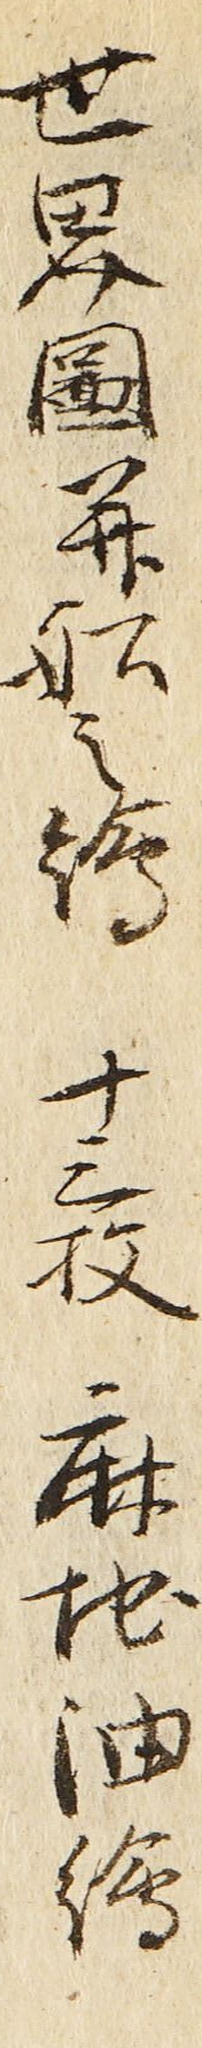世界図并船之絵十三枚麻地油絵二枚
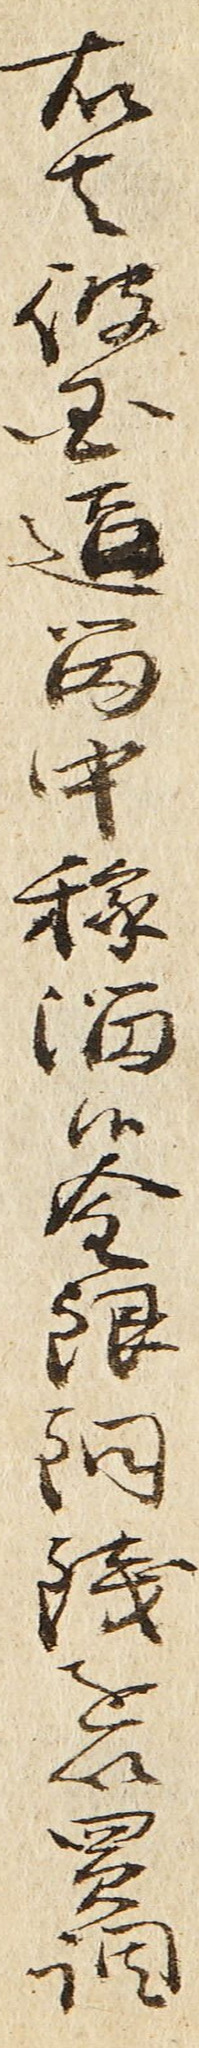右は彼国逗留中稼溜候金銀銅銭を以買調
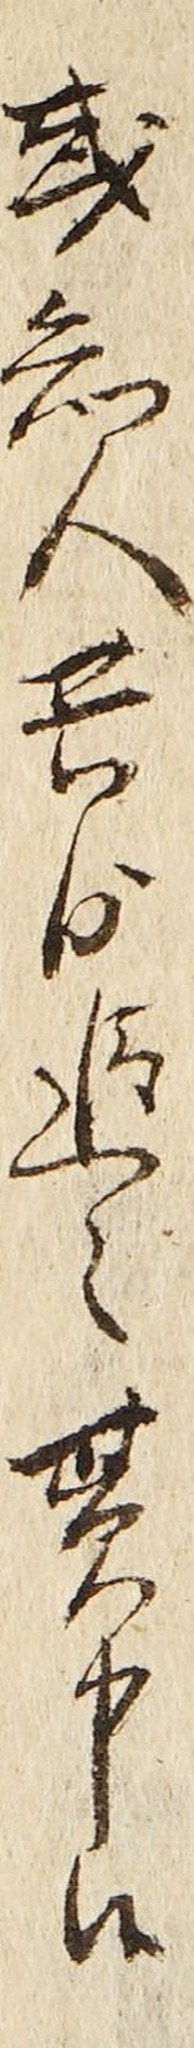或知人共ゟ追々貰申候
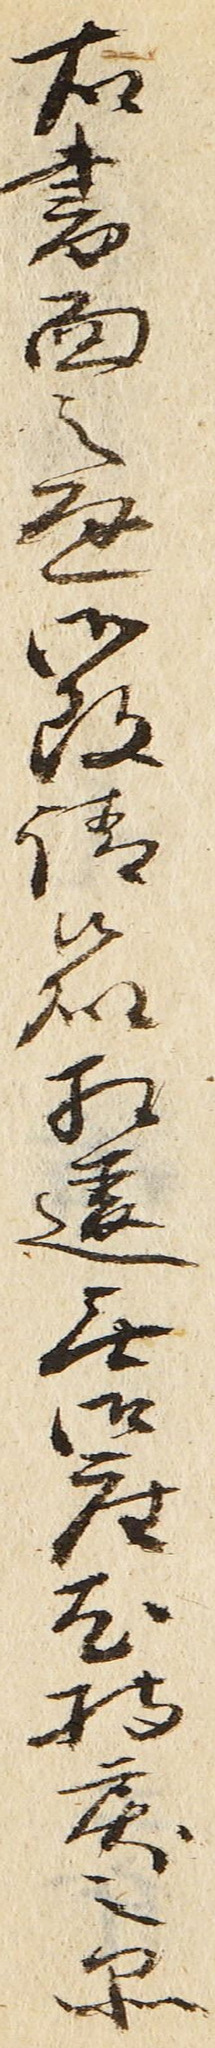右書面之通御改請候処相違無御座尤持戻之品
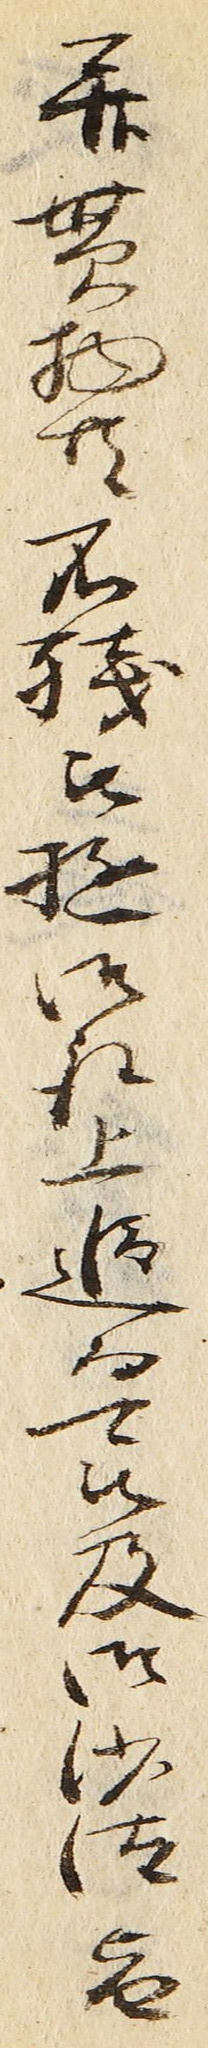并貰物共不残被遊御取上追而可被及御沙汰旨
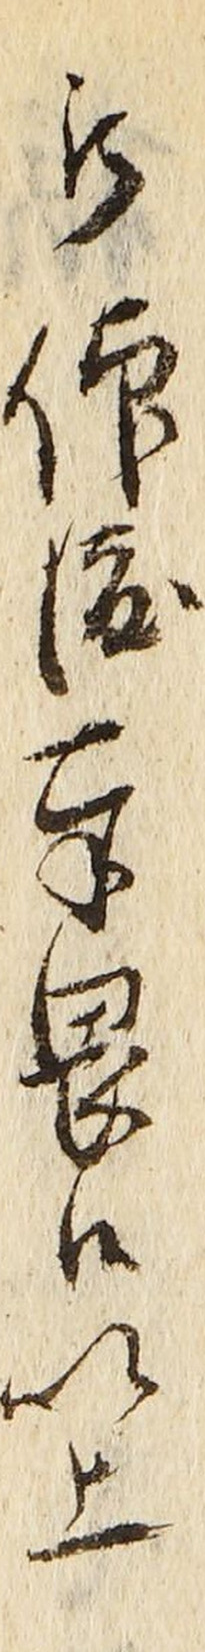被仰渡奉畏候以上
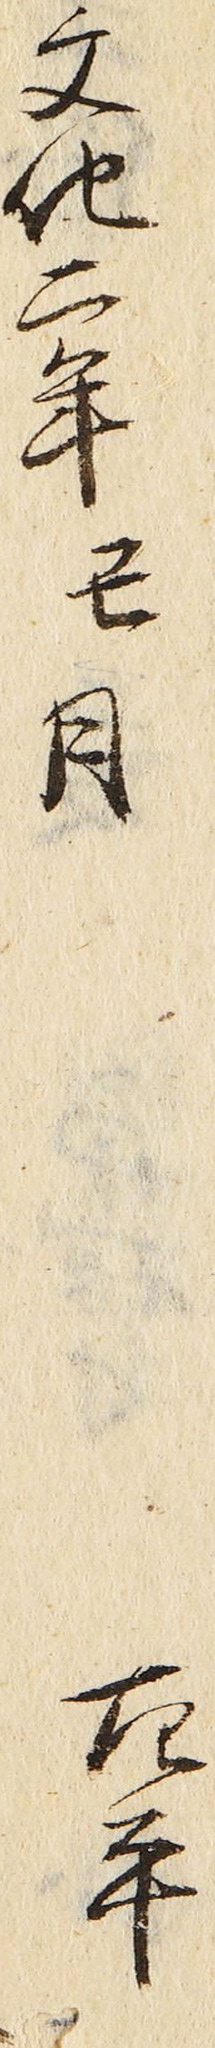文化二年丑月左平
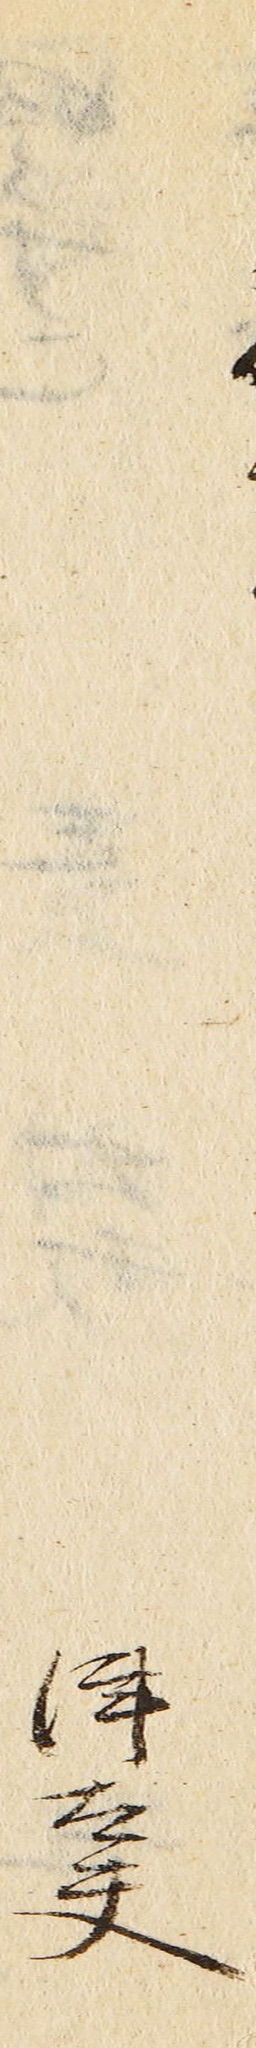津太夫
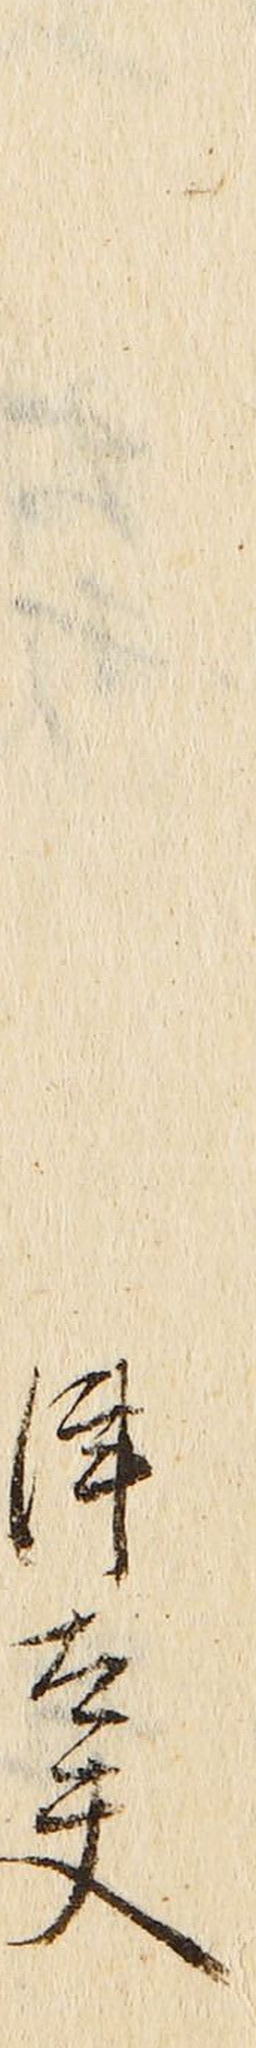津太夫
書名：漂民後記
